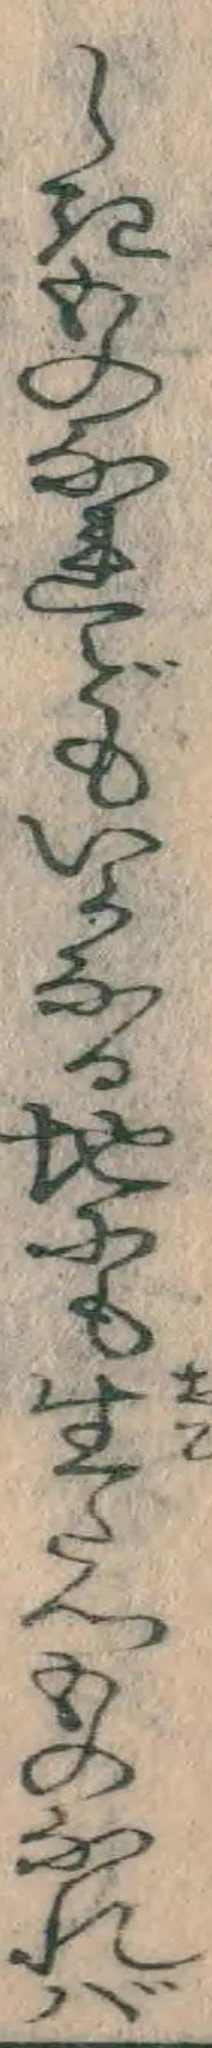しきものなれどもいかなる地にも生たつものなれば
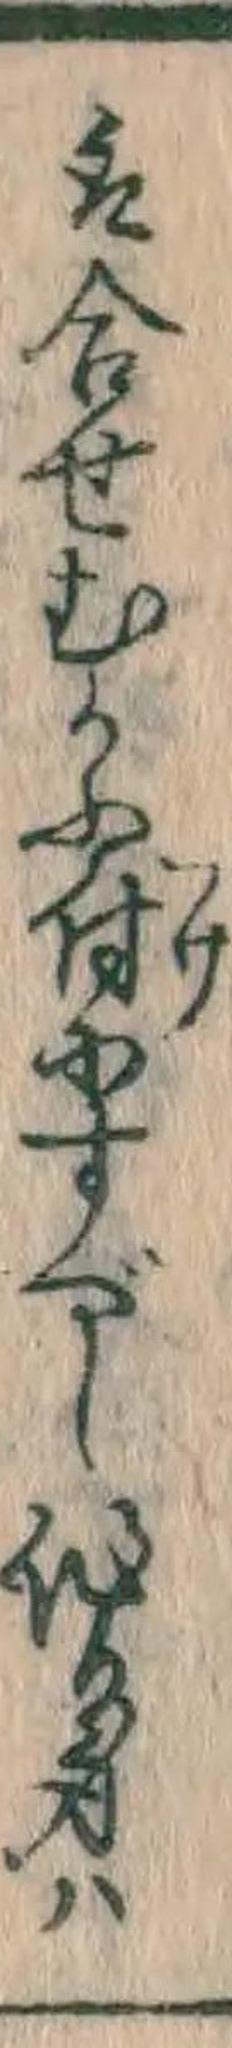取合せむかふ付にすべし作り身は
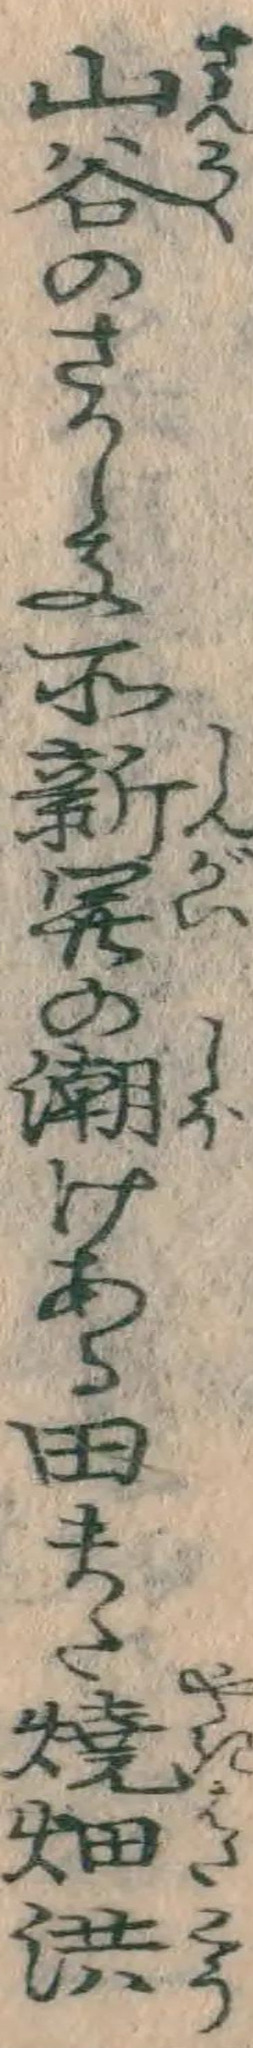山谷のさかしき所新開の潮けある田また焼畑洪
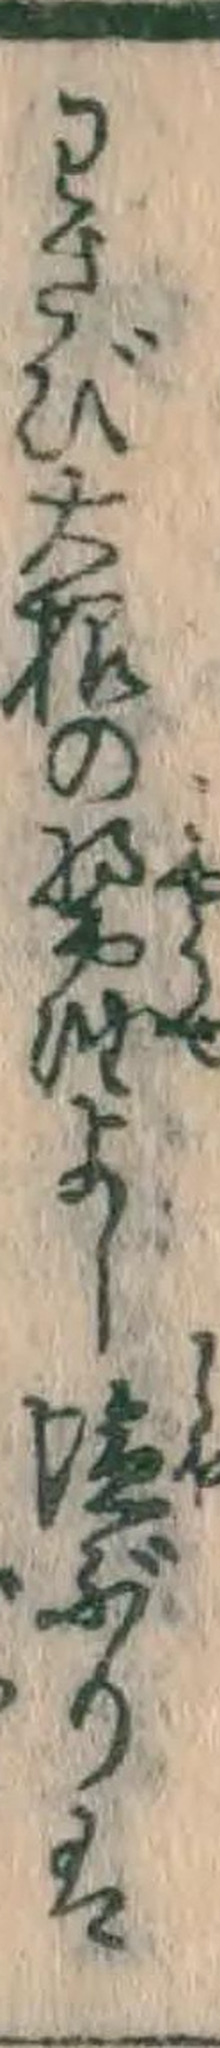わさび大根の醬油よし塩ぶりは
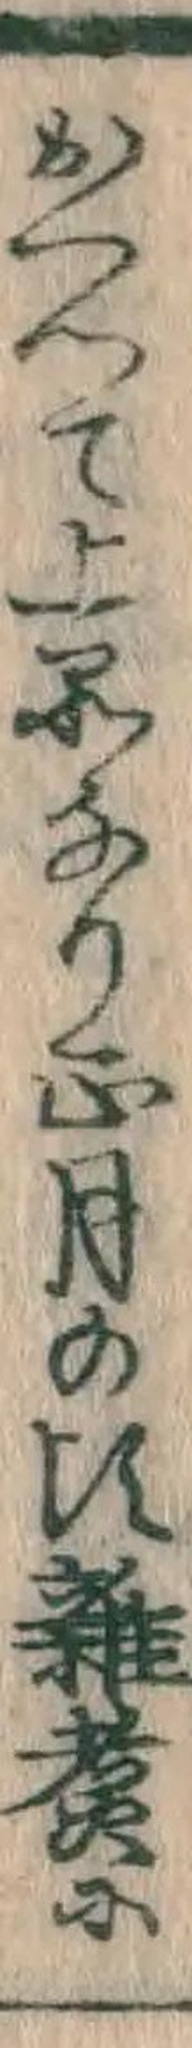かへつて上品なり正月の頃雑煮に
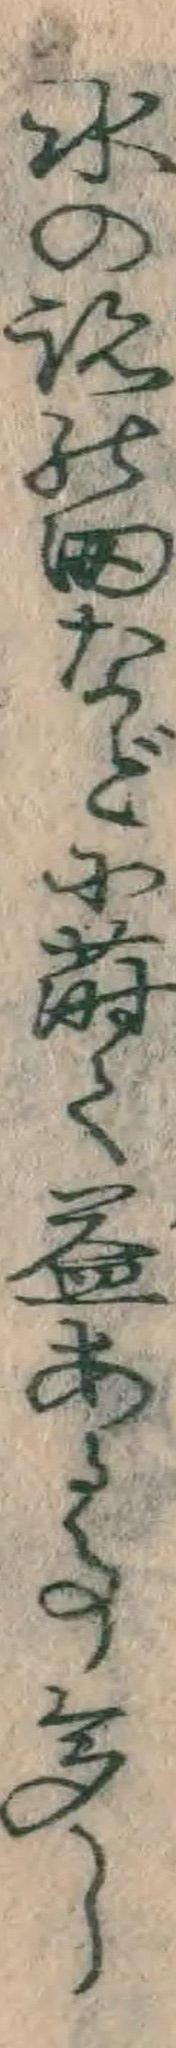水の跡の田などに蒔て益ある事多し
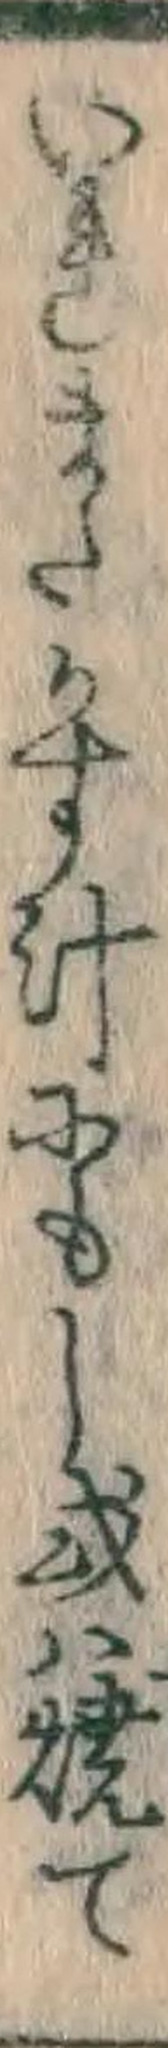いれまたかす汁にもし或は焼て
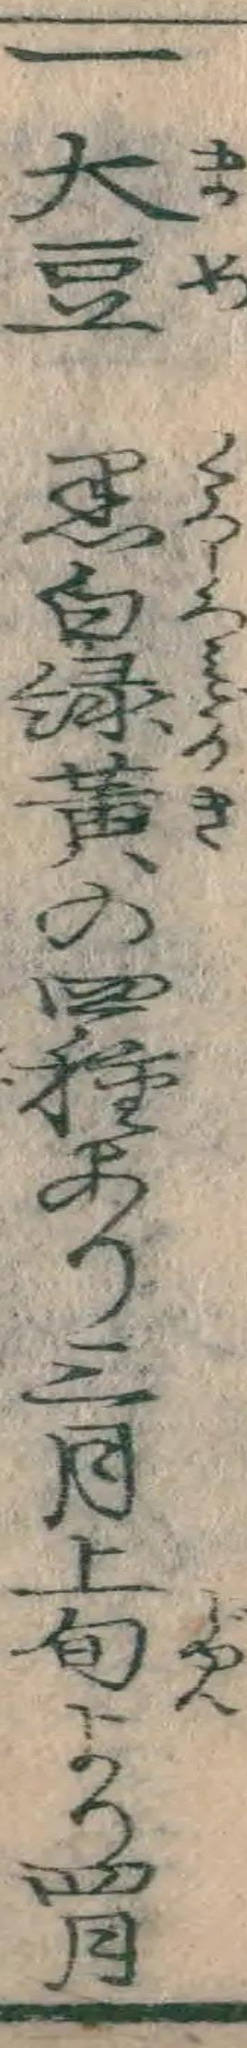一大豆黒白緑黄の四種あり三月上旬より四月
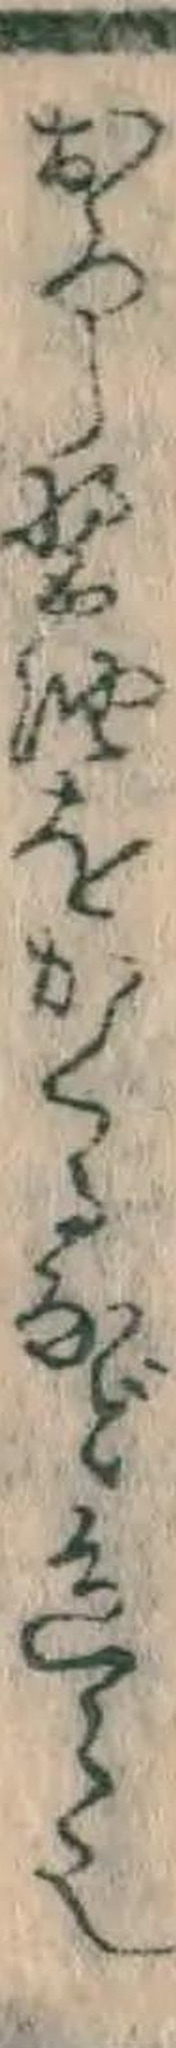おろし醬油をかくるなど色々也
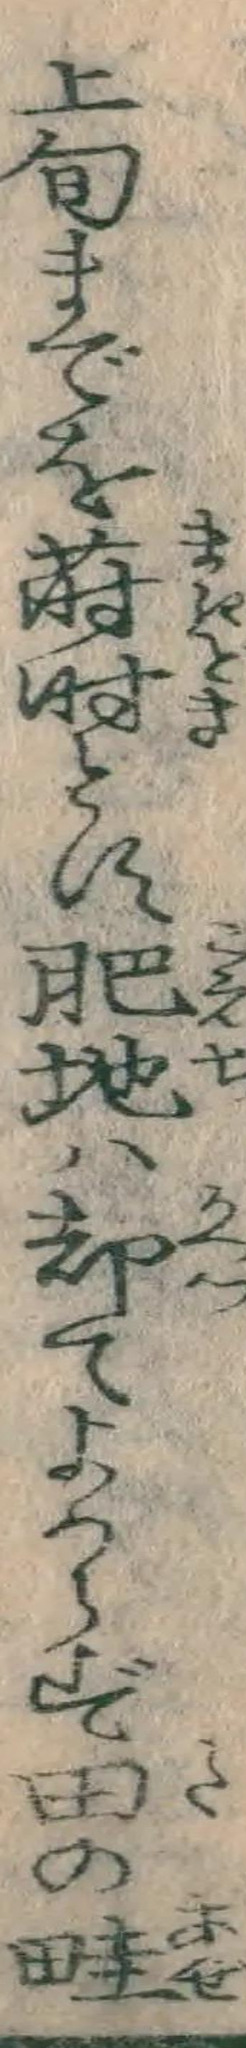上旬までを蒔時とす肥地は却てよからず田の畦
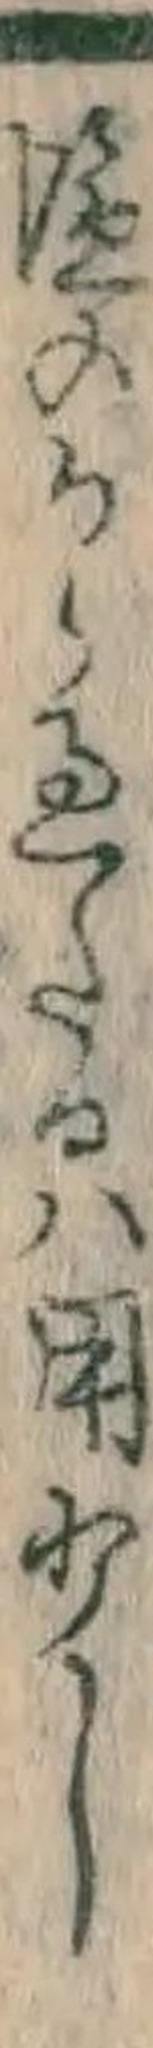塩のから過たるは用少し
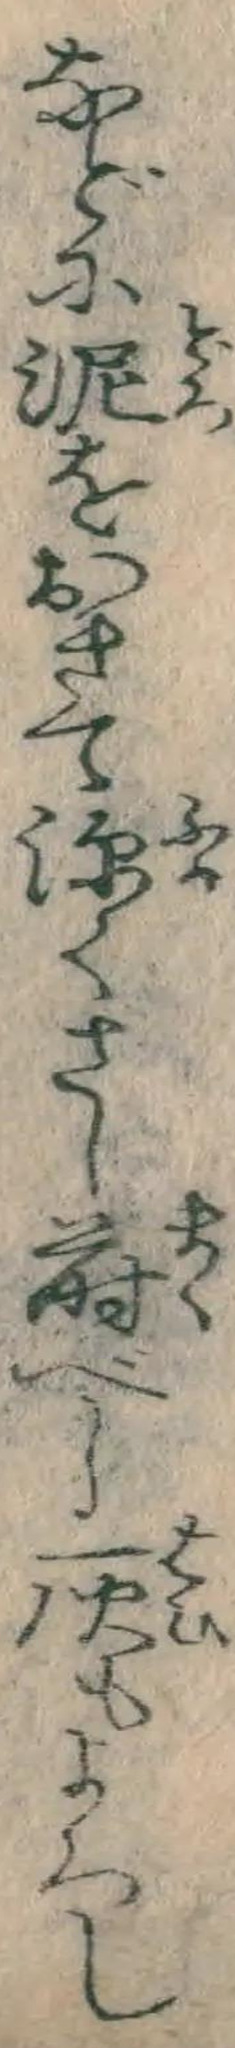などに泥をおきて深くさし蒔べし灰もよろし
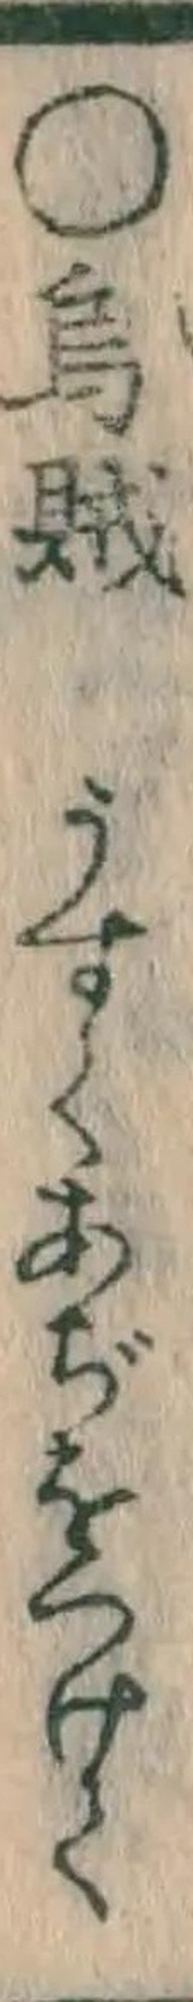○烏賊うすくあぢをつけて
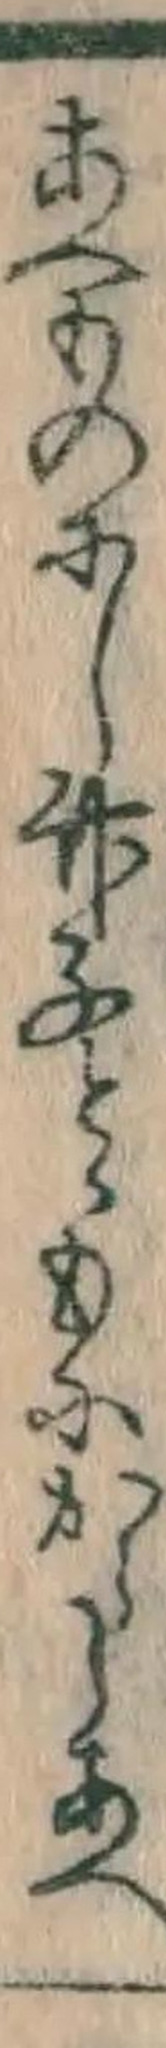あへものにし竹子とゝもにからしあへ
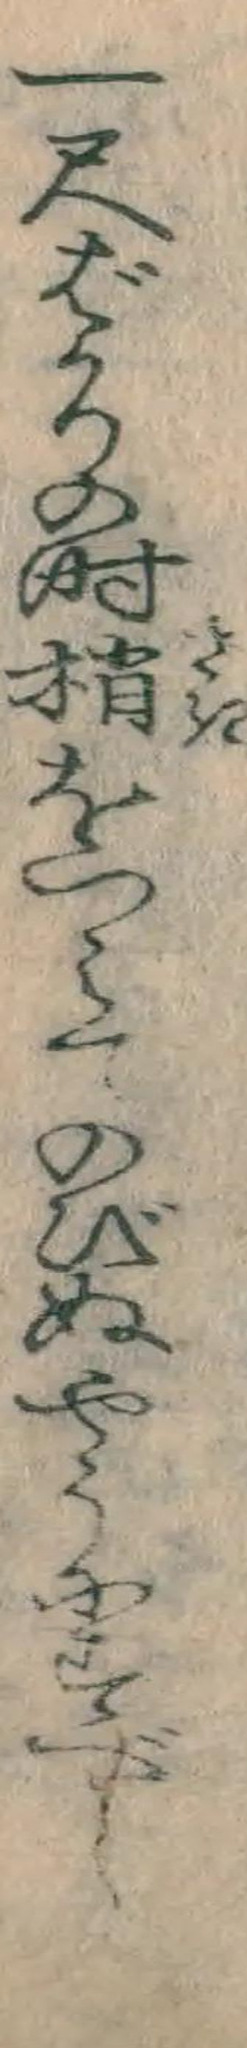一尺ばかりの時梢をつみてのびぬやうにすべし

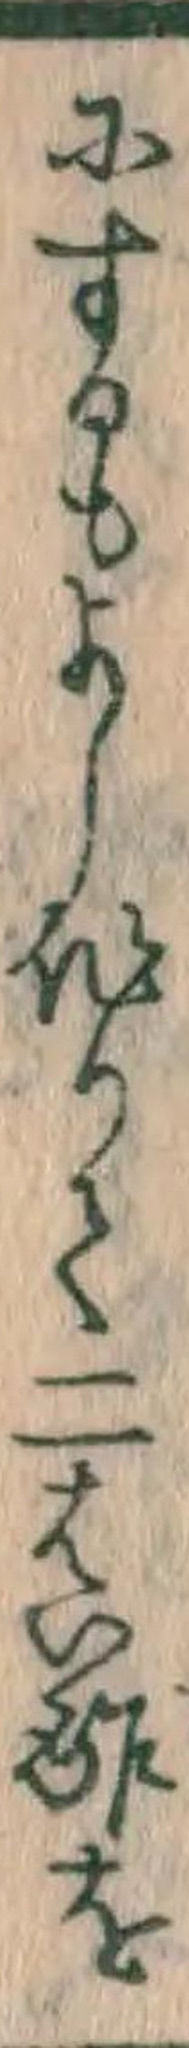にするもよし作りて二はい酢を
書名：広益秘事大全 3巻. [5]
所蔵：国立国会図書館 National Diet Library, JAPAN
